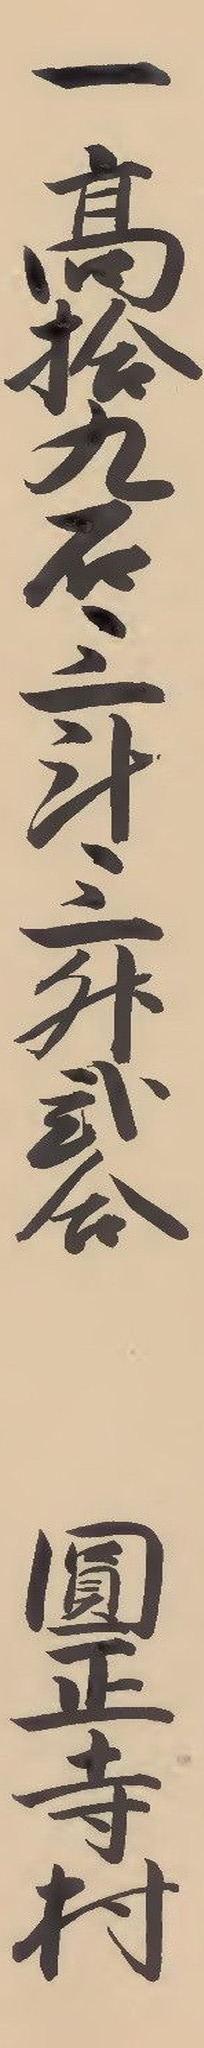一高拾九石三斗三升弐合円正寺村
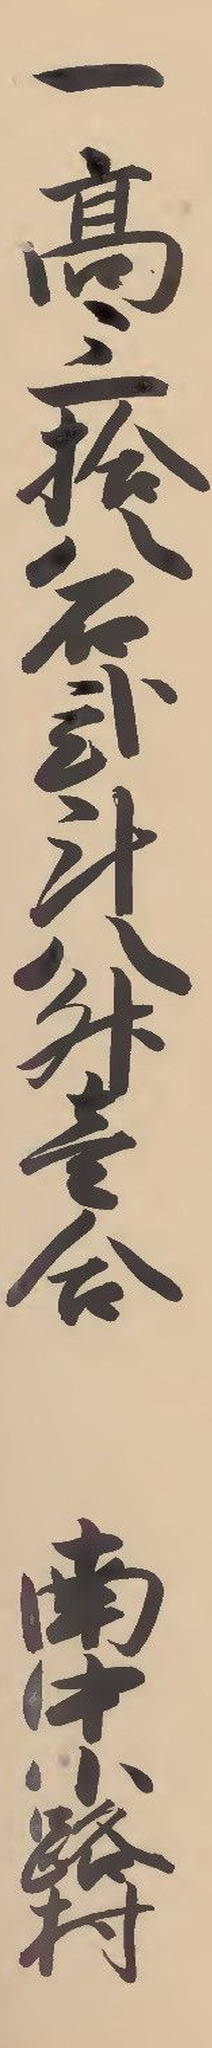一高三拾八石弐斗八升壱合南中小路村
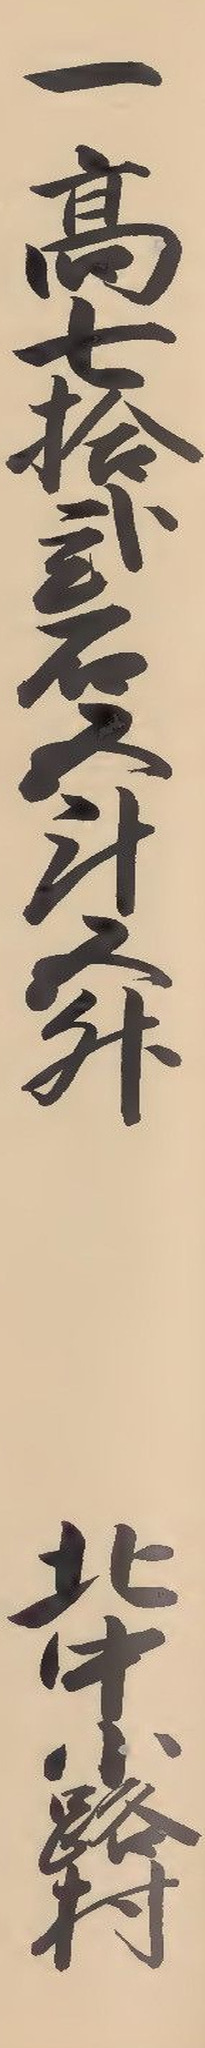一高七拾弐石五斗五升北中小路村
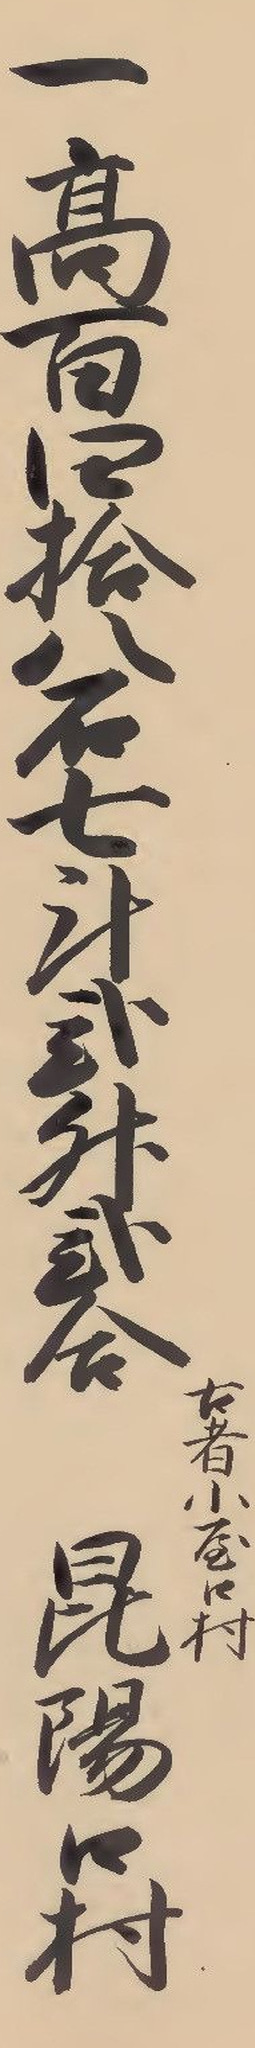一高百四拾八石七斗弐升弐合昆陽口村
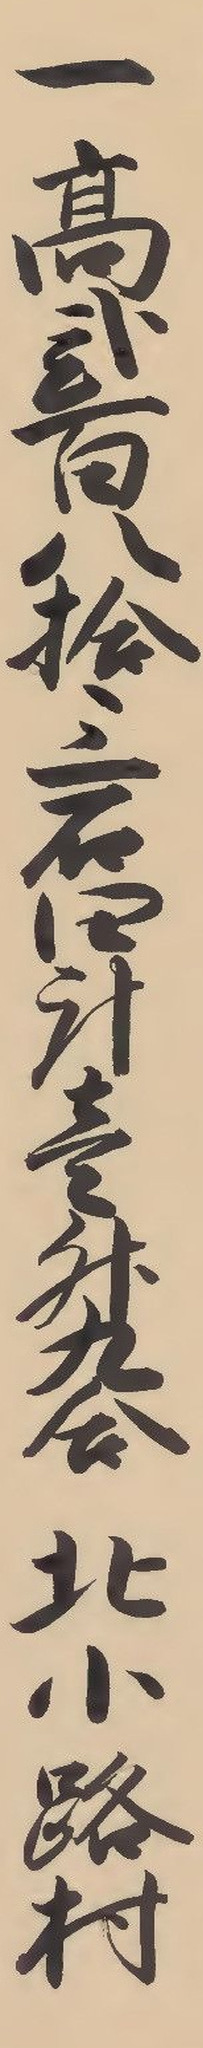一高弐百八拾三石四斗壱升九合北小路村
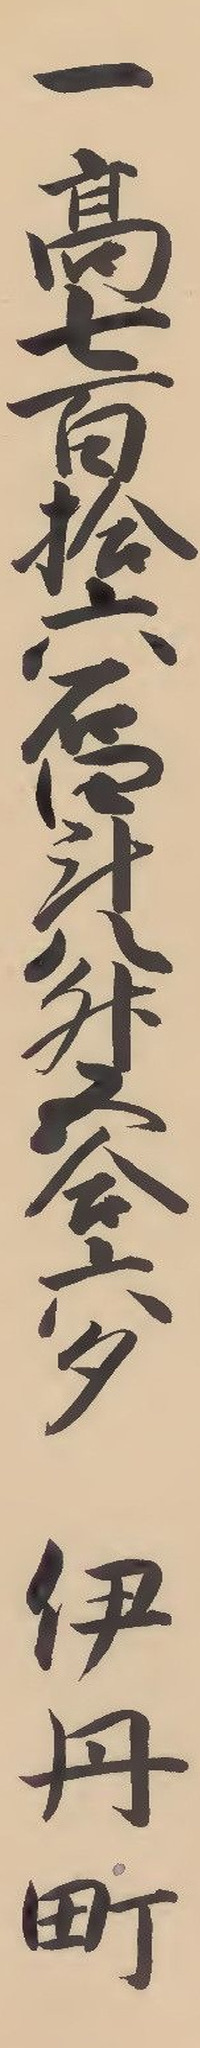一高七百拾六石四斗八升五合六勺伊丹町

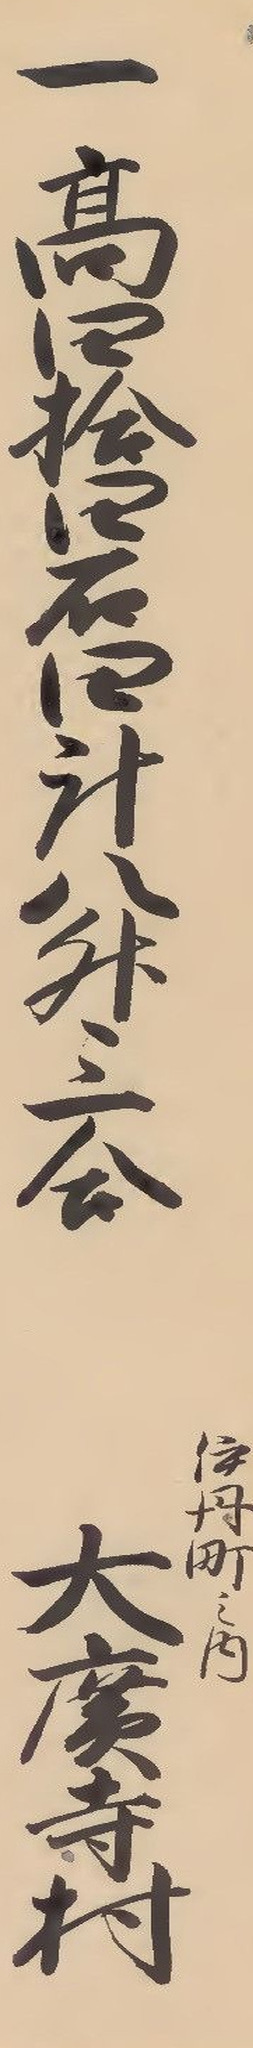一高四拾四石四斗八升三合大広寺村
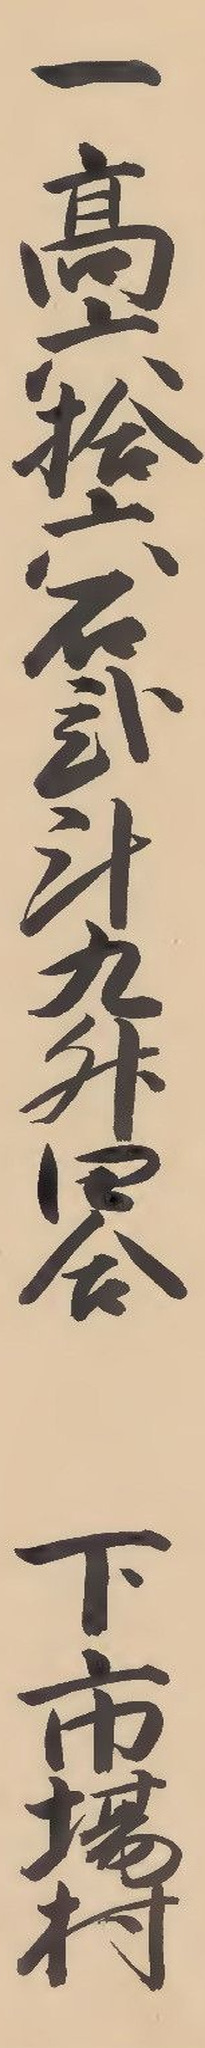一高六拾六石弐斗九升四合下市場村
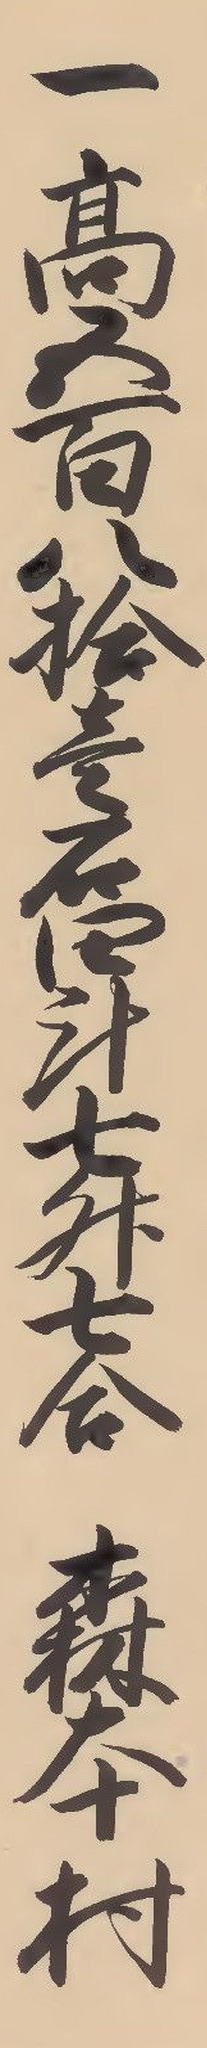一高五百八拾壱石四斗七升七合森本村
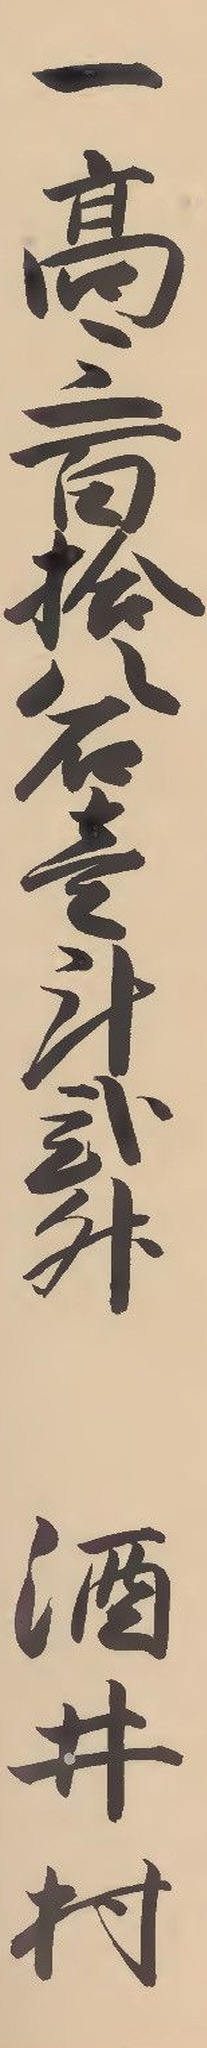一高三百拾八石壱斗弐升酒井村
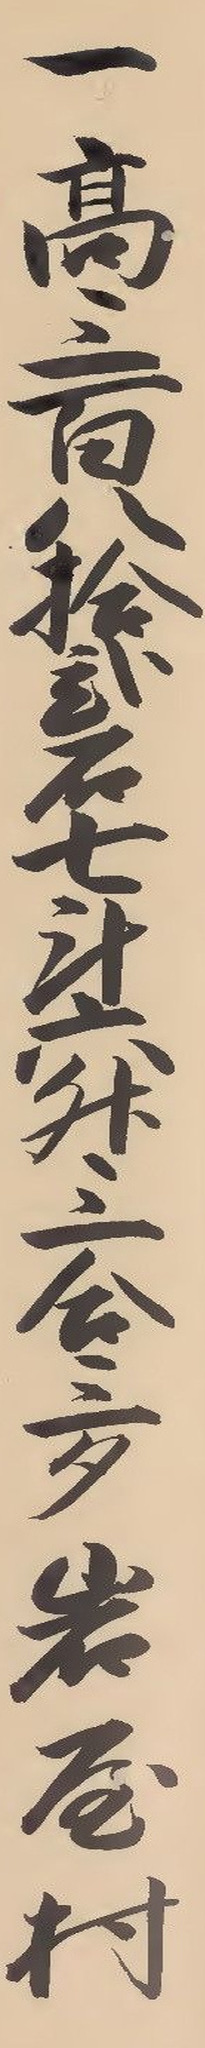一高三百八拾弐石七斗六升三合三勺岩屋村
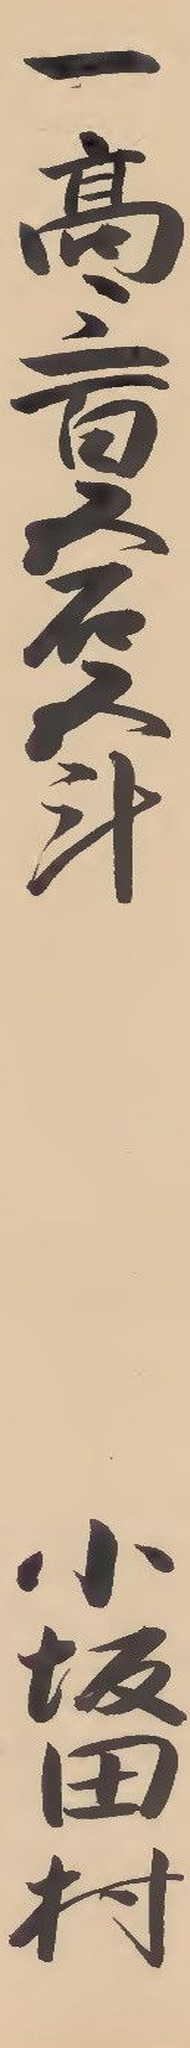一高三百五石五斗小坂田村
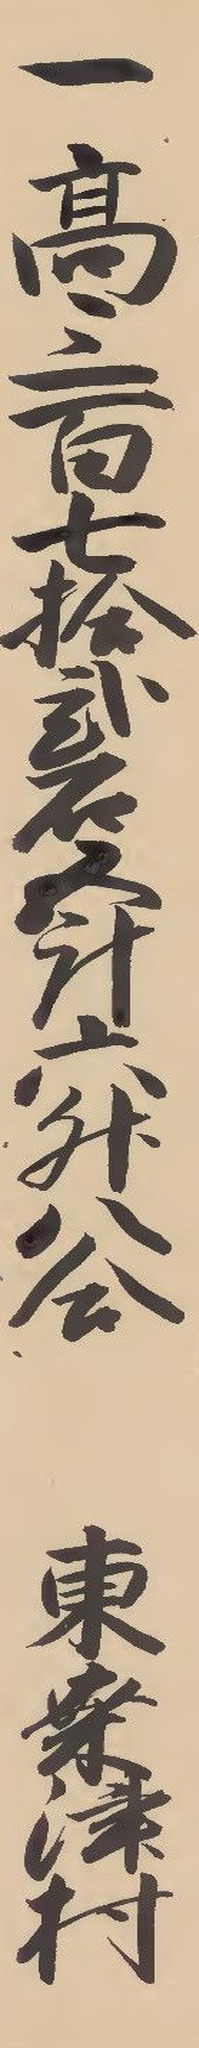一高三百七拾弐石五斗六升八合東桑津村
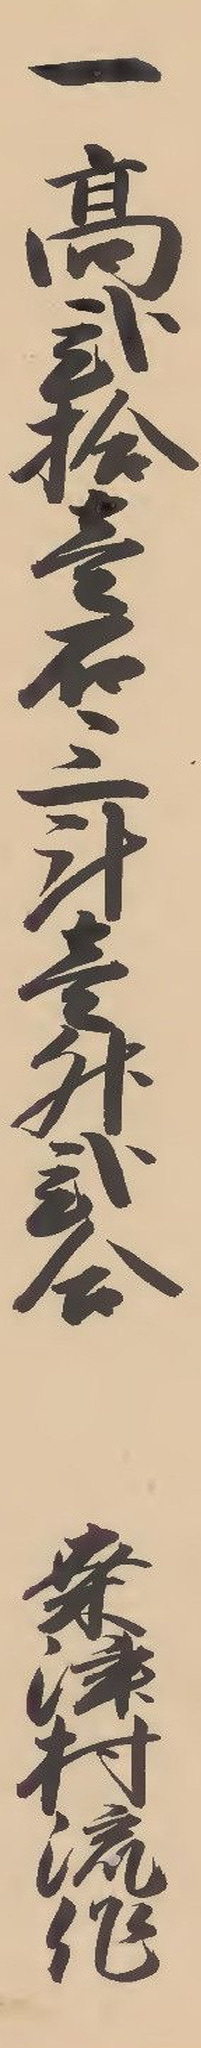一高弐拾壱石三斗壱升弐合桑津村流作

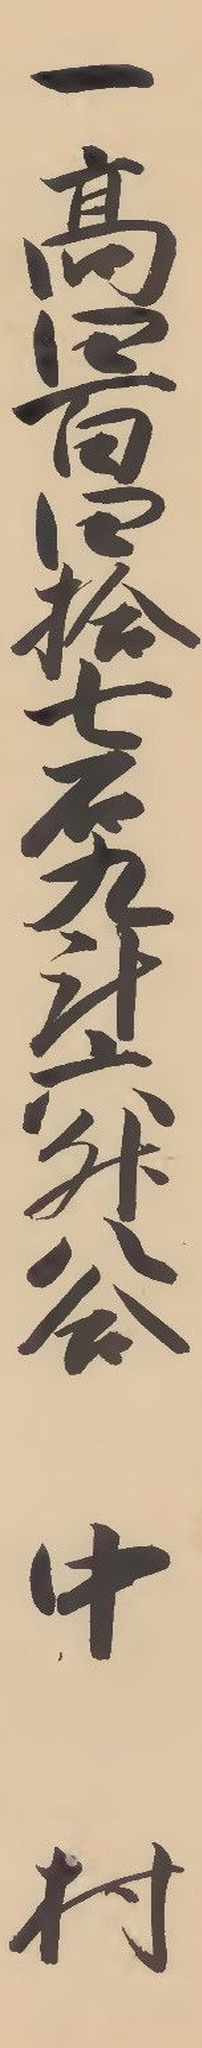一高四百四拾七石九斗六升八合中村
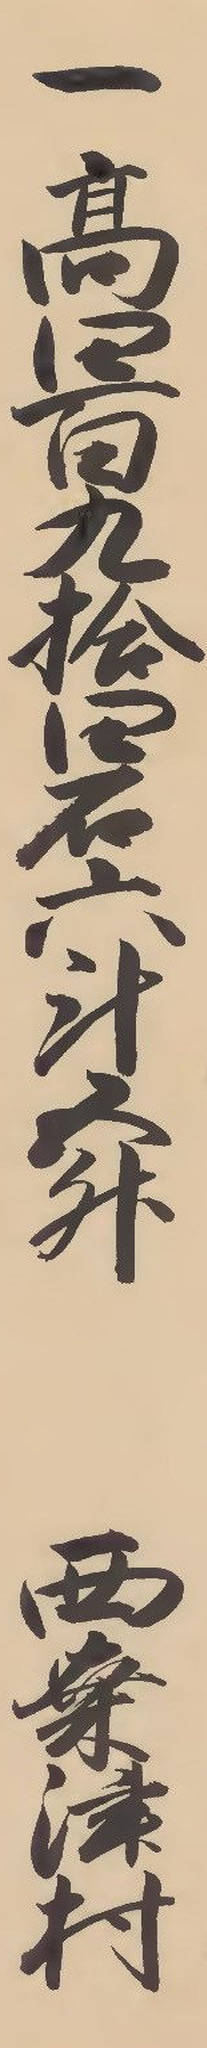一高四百九拾四石六斗五升西桑津村
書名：摂津国郷帳
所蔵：国立公文書館 National Archives of Japan
